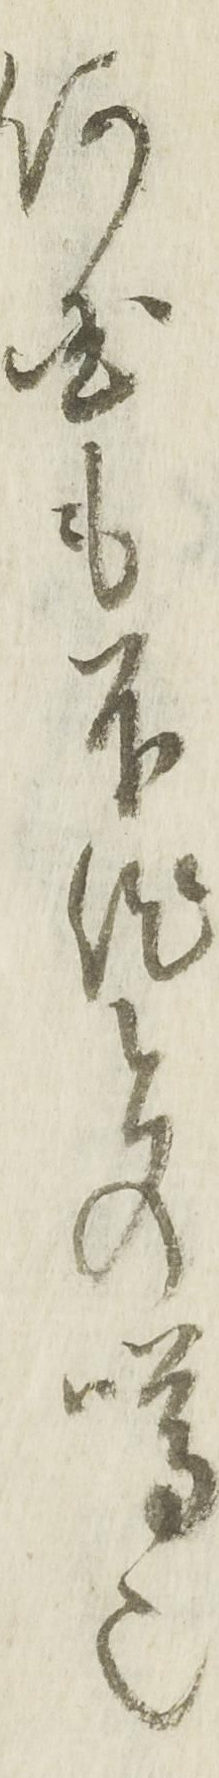何国も不作との噂也
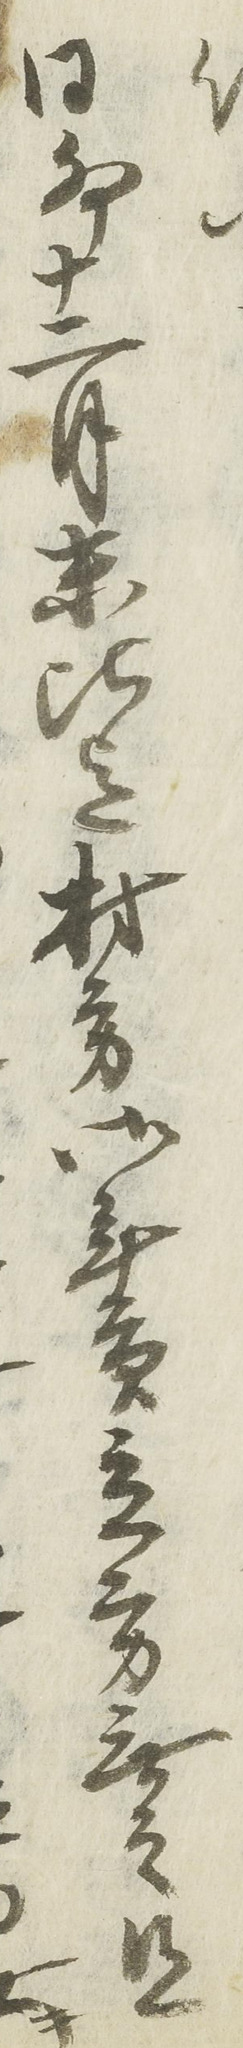一同卯十二月末比迄村方御年貢立方無之且
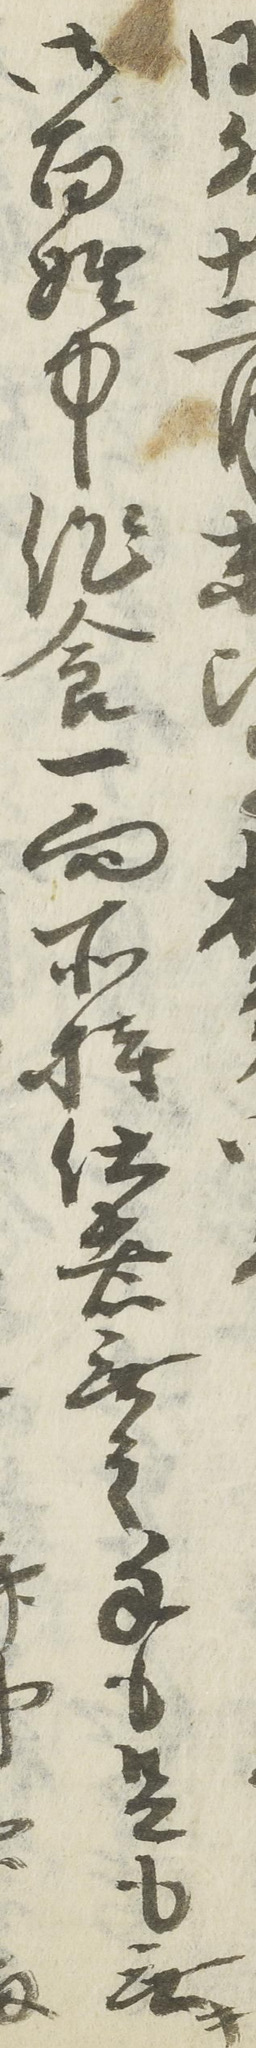御百姓中作食一向所持仕者無之手も足も無キ
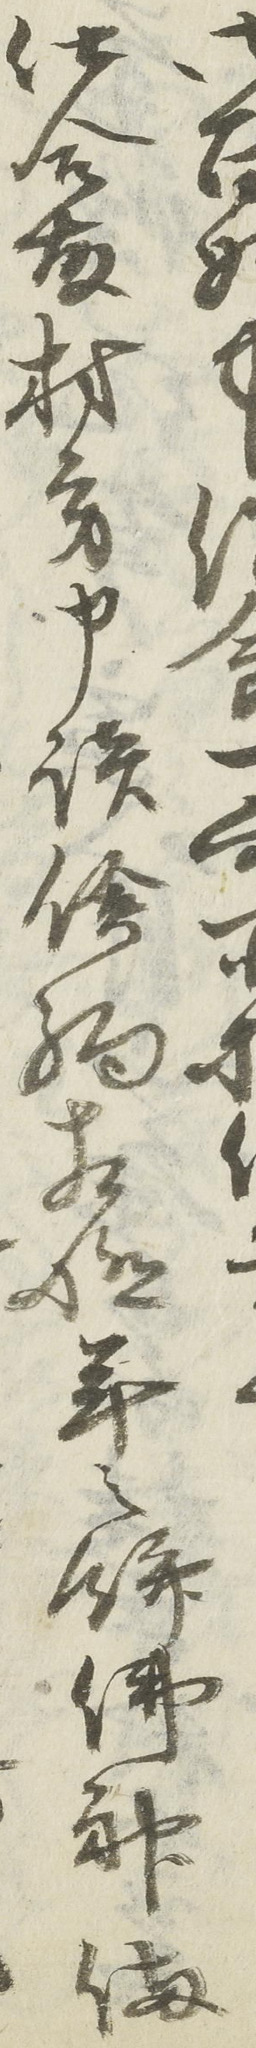仕合故村方申談倹約相極年之餅仏神備
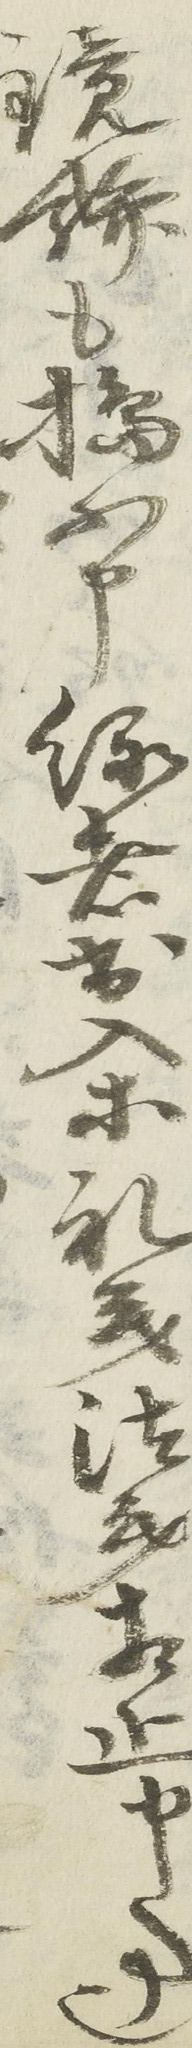鏡餅も搗不申縁者出入等礼義法義相止申事也
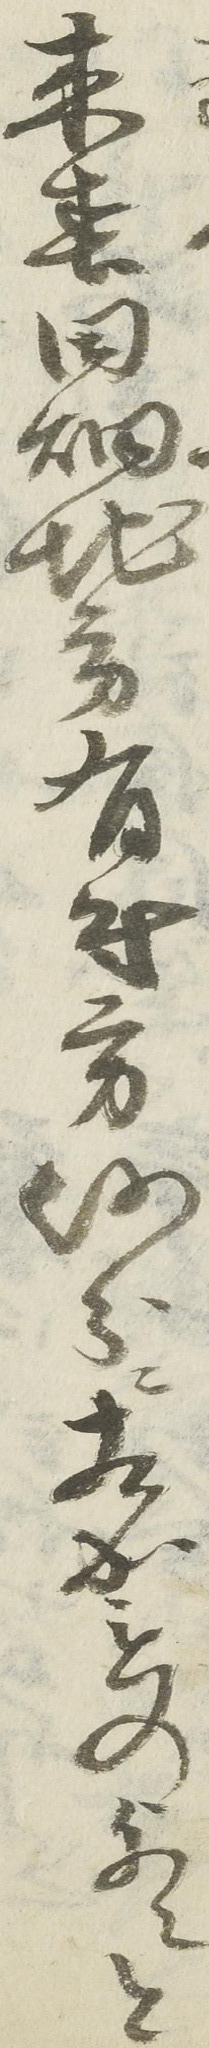来春田畑地方有付方何分ニ相成もの歟と
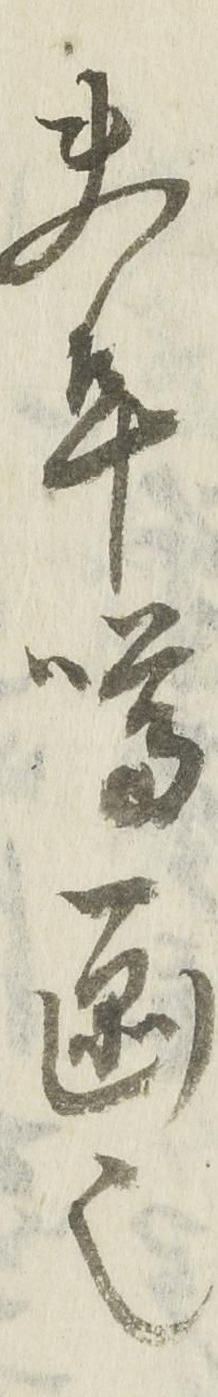夫年噂区也
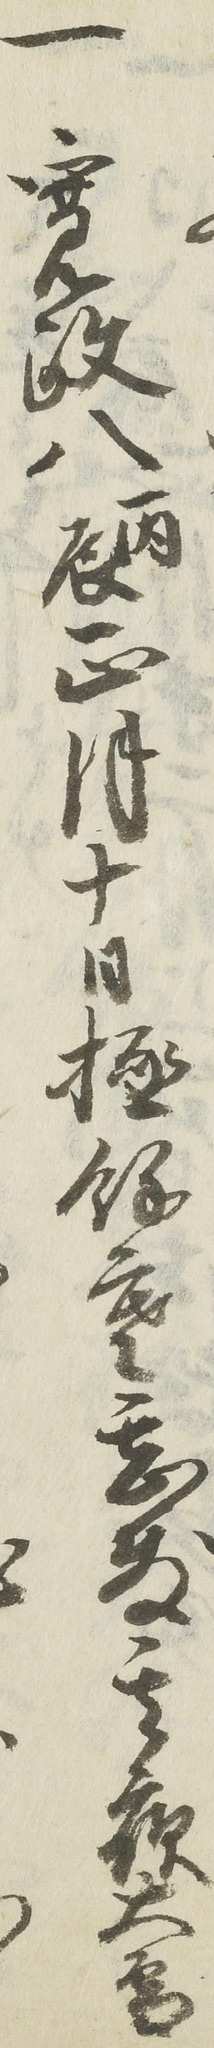一寛政八丙辰正月十日極餘寒甚敷其夜大雪
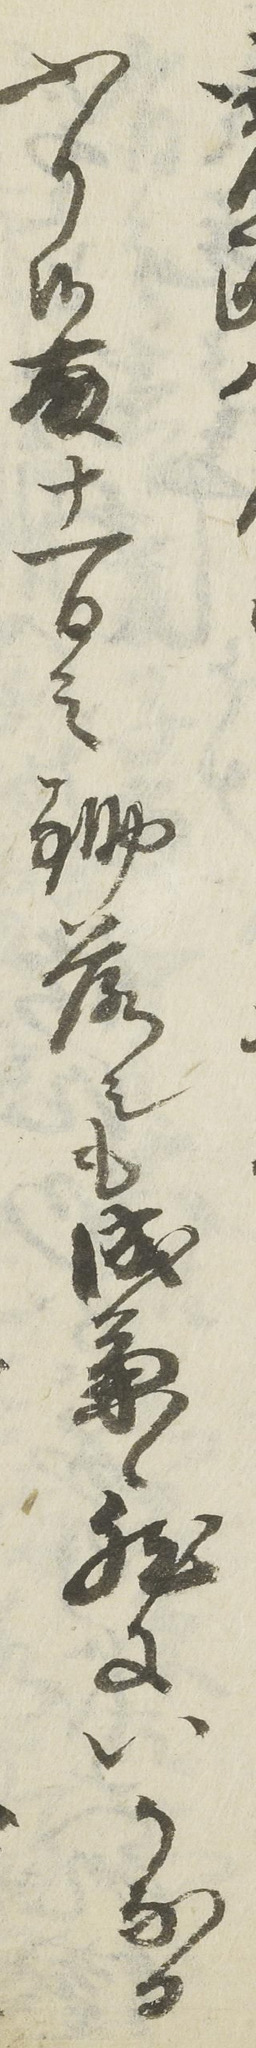ふり候故十一日之鋤落シも成兼候然にいかなる
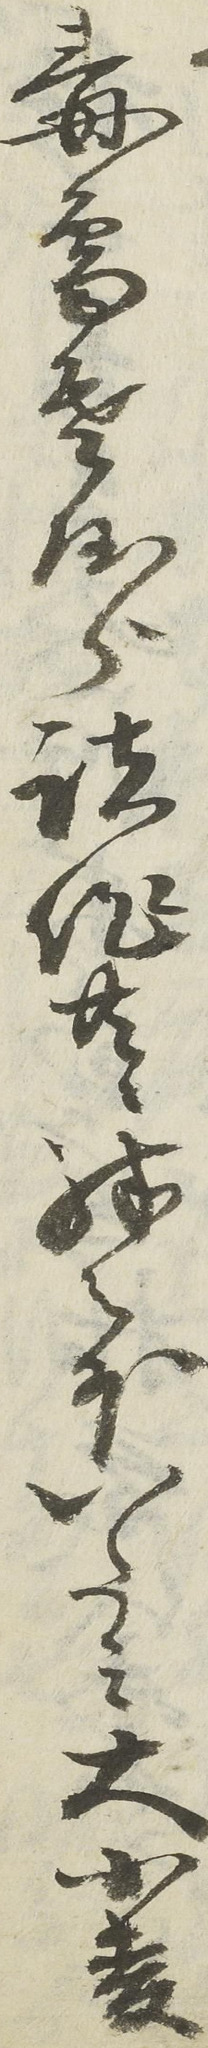毒雪寒やら諸作共々殊の外いたみ大小麦

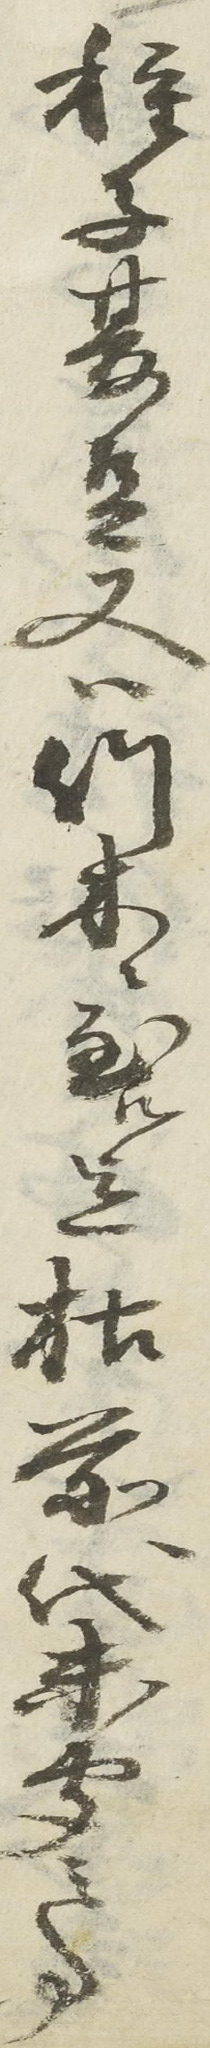種子夏豆又は竹木ニ至ル迄枯前代未聞之事
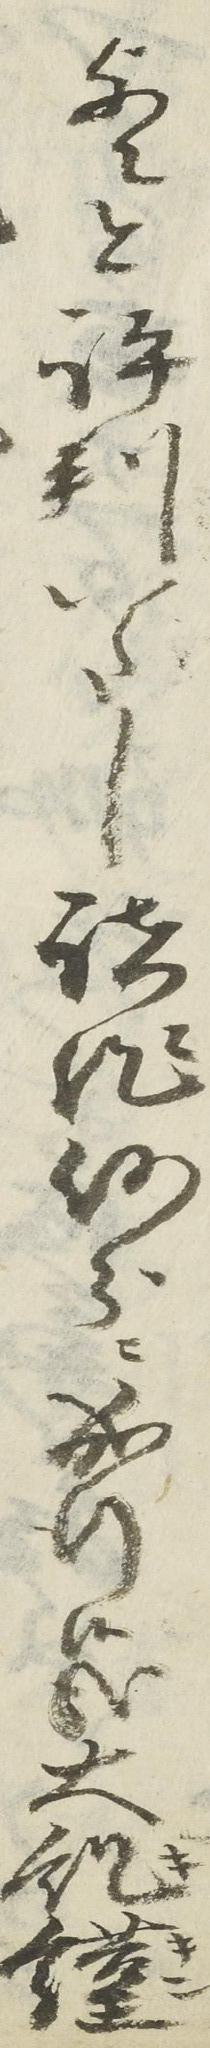歟と評いたし諸作何分ニ成行候哉大飢饉
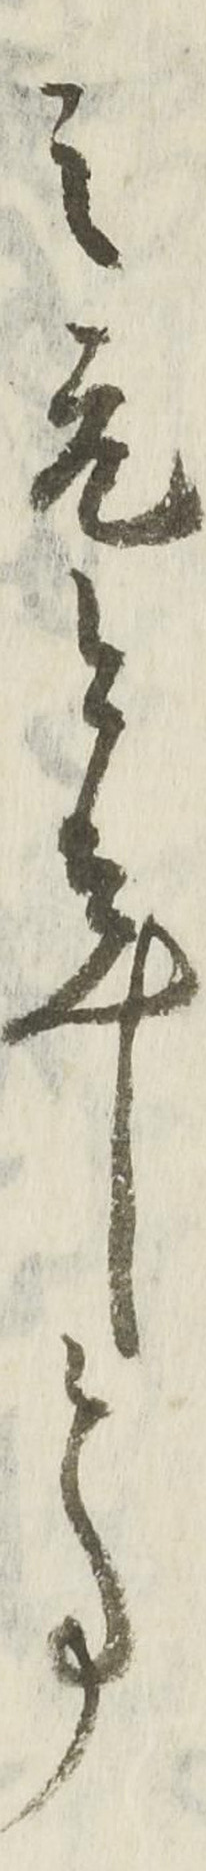之元と御坐候事
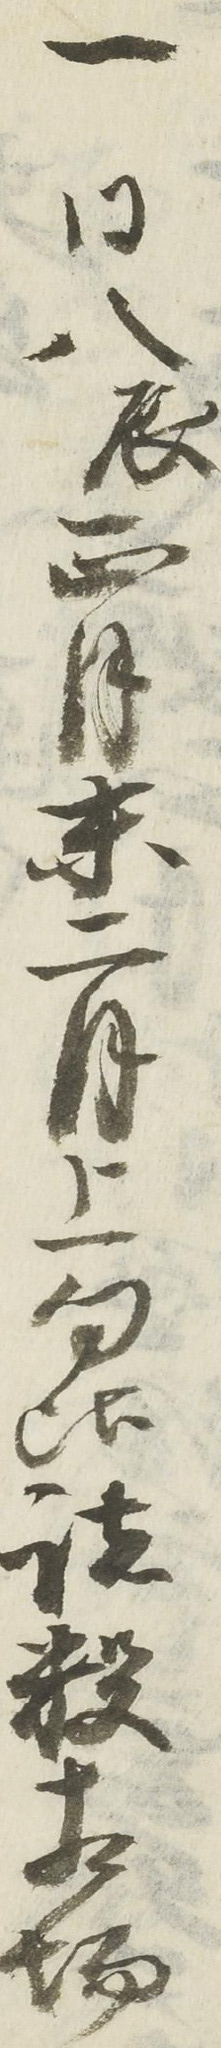一同八辰正月末二月上旬比諸穀相場
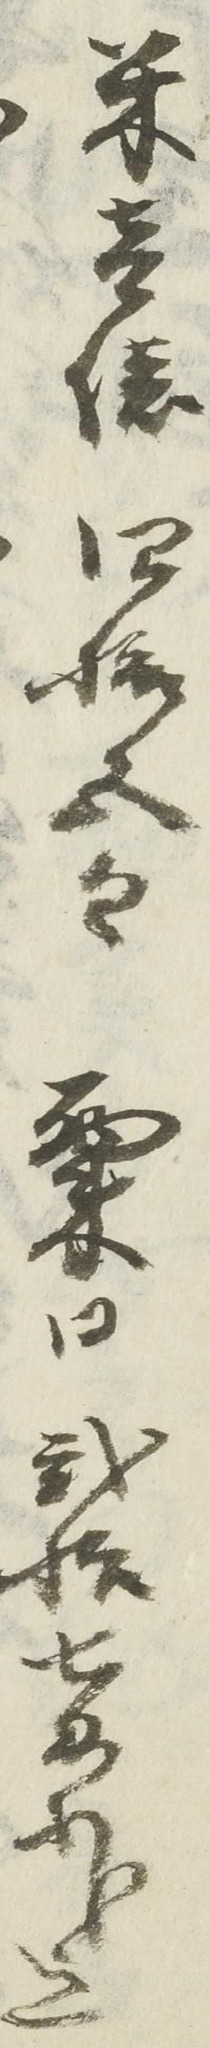米壱表四拾五匁粟同弐拾七匁九分迄
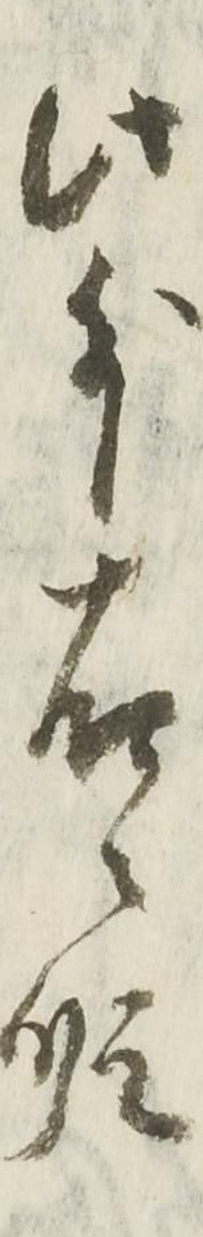此外右ニ順
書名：後見笑
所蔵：東京大学地震研究所図書室 Earthquake Research Institute Library, The University of Tokyo, JAPAN
